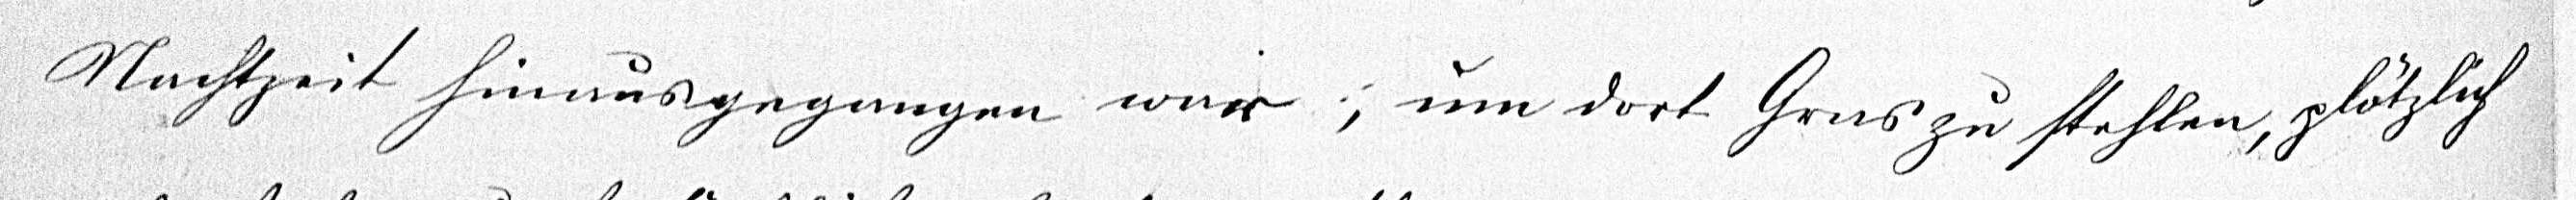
Nachtzeit hinausgegangen war; um dort Gras zu stehlen, plötzlich
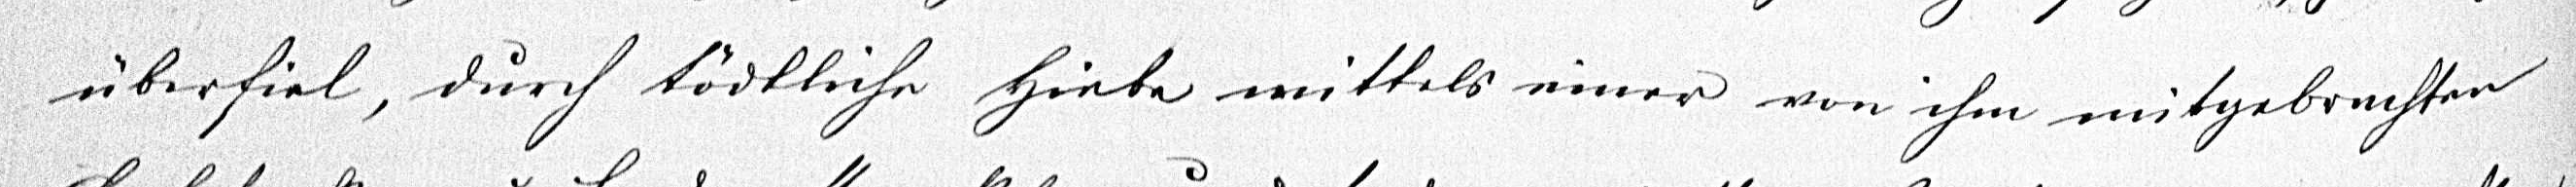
überfiel, durch tödtliche Hiebe mittels einer von ihm mitgebrachten
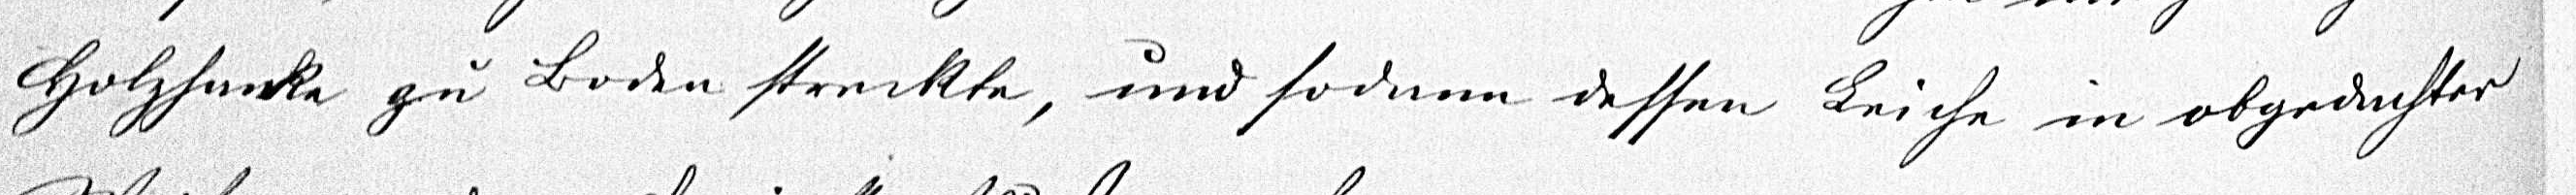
Holzhaxxke zu Boden streckte, und sodann dessen Leiche in obgedachter
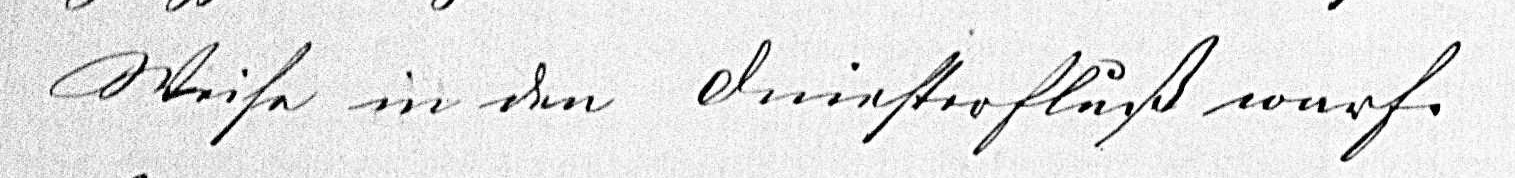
Weise in den Dniesterfluß warf.
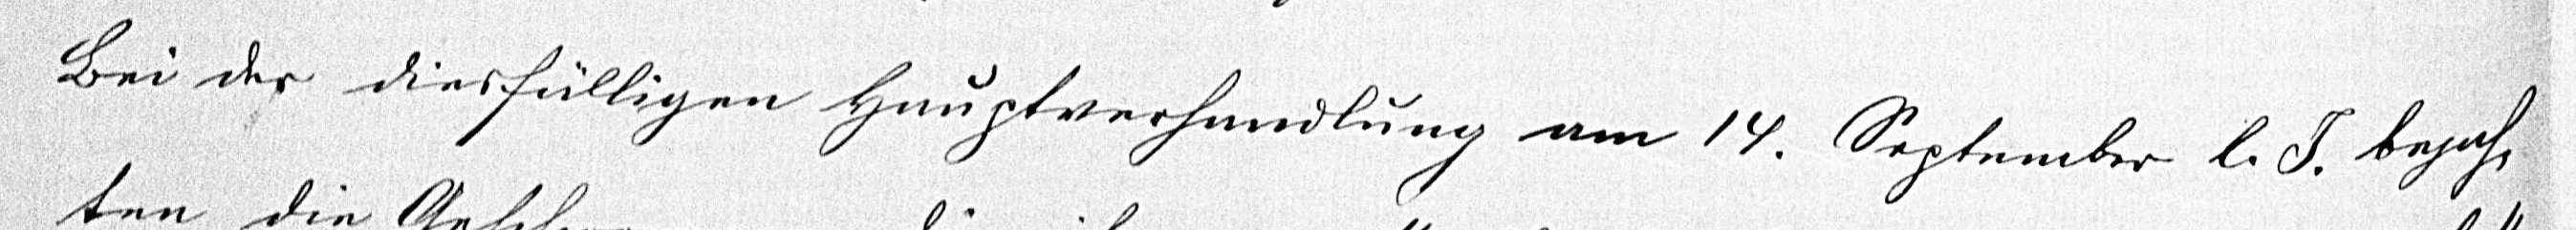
Bei der diesfälligen Hauptverhandlung am 14. September l.J. bejah¬
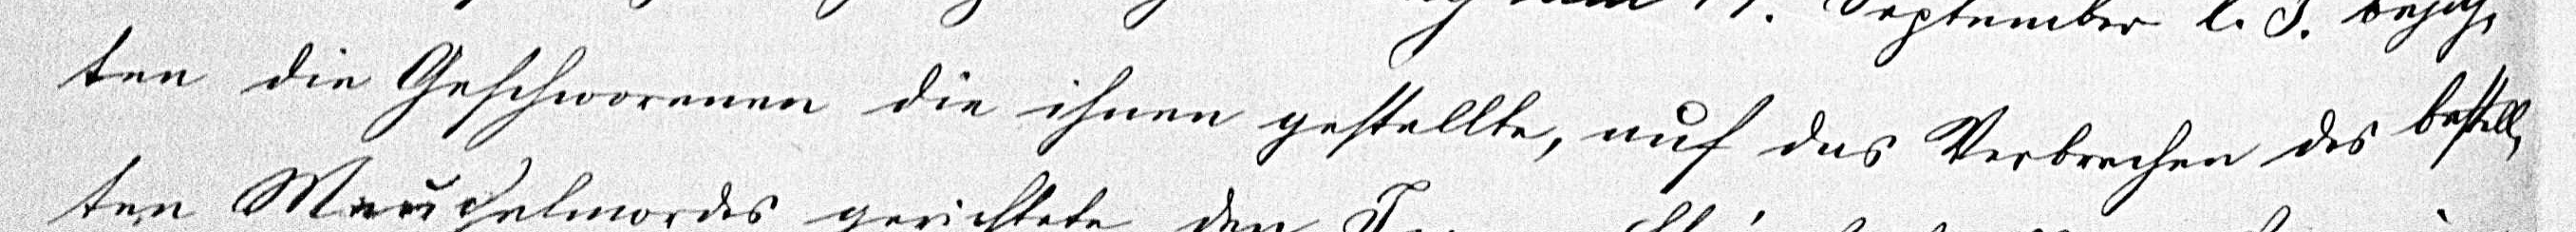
ten die Geschworenen die ihnen gestellte, auf das Verbrechen des bestell¬
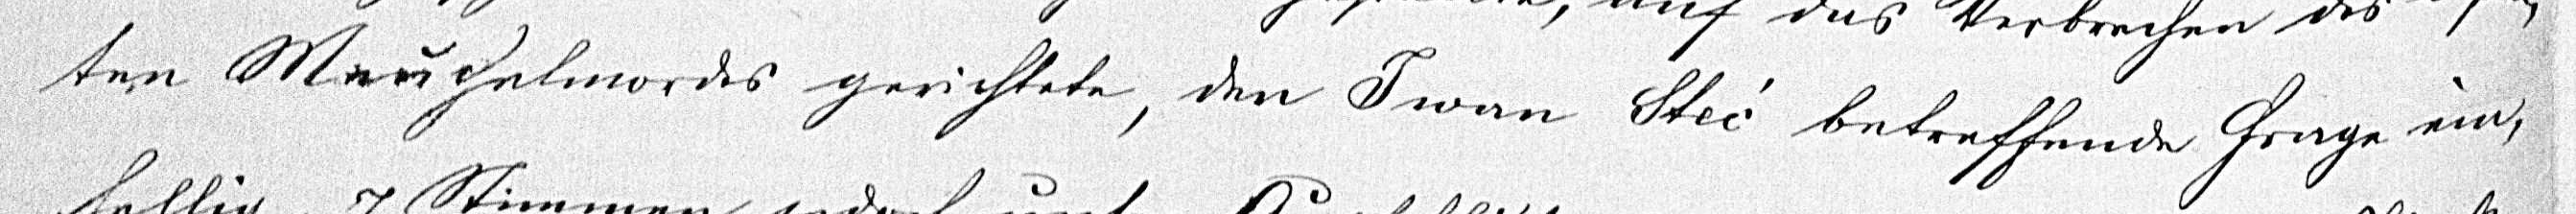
ten Meuchelmordes gerichtete, den Jwan Steć betreffende Frage ein,
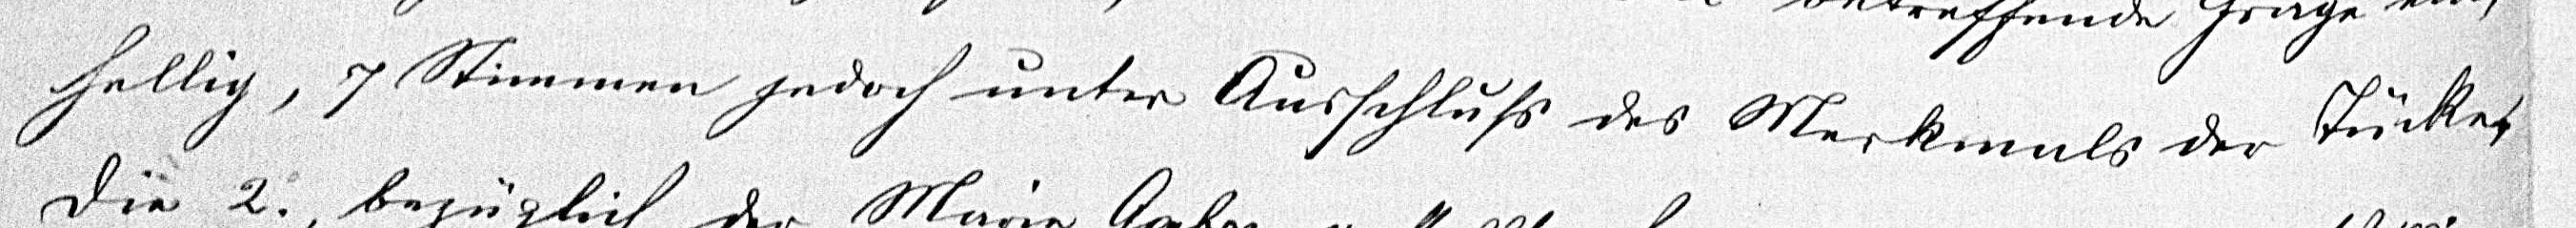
hellig, 7 Stimmen jedoch unter Ausschluss des Merkmals der Tücke,
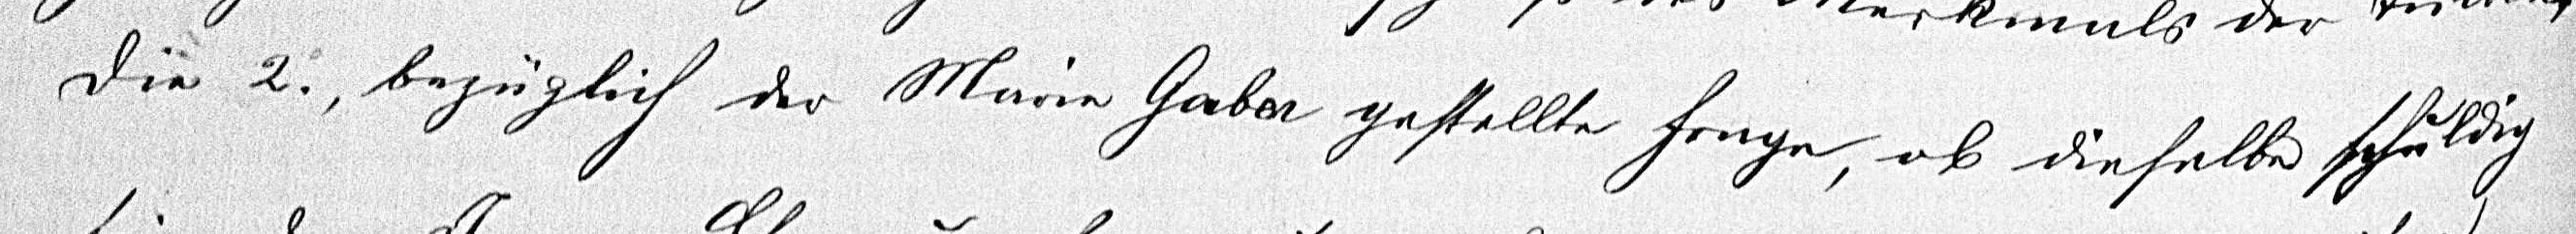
die 2., bezüglich der Marie Gaber gestellte Frage, ob dieselbe schuldig
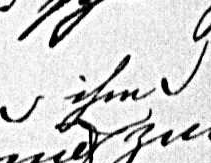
ihm
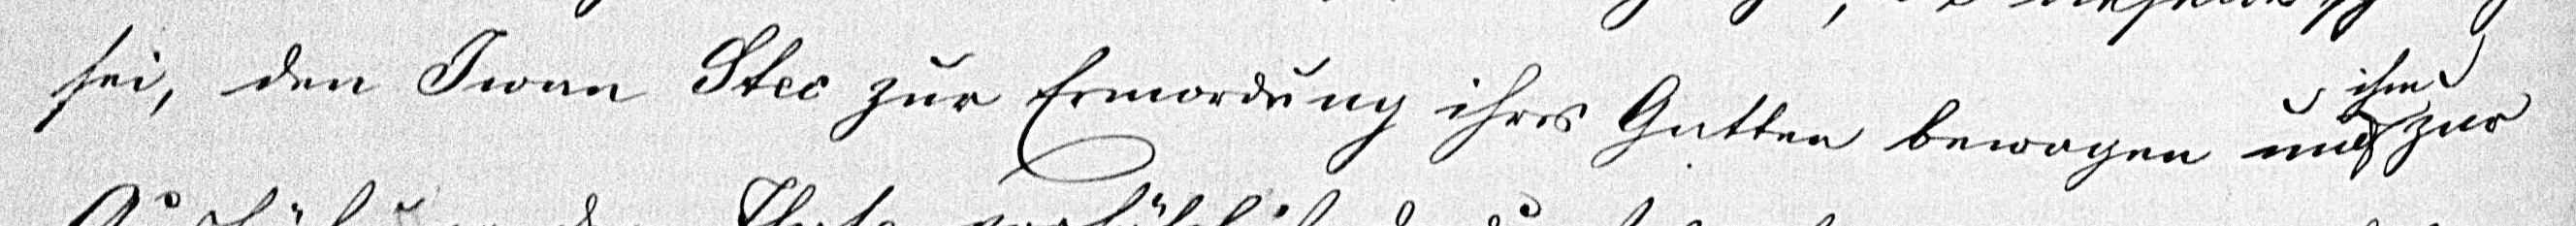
sei, den Jwan Stec zur Ermordung ihres Gatten bewogen und zur
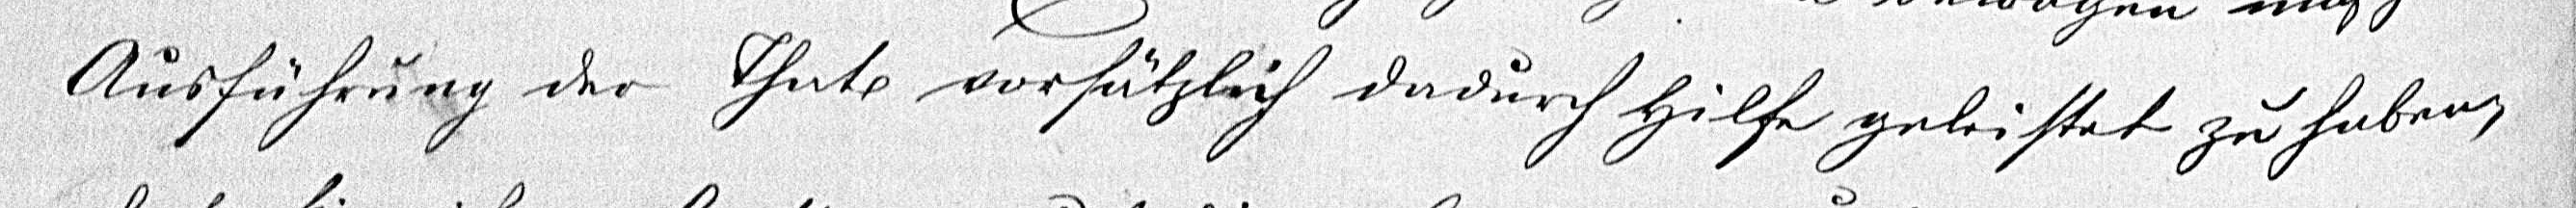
Ausführung der That vorsätzlich dadurch Hilfe geleistet zu haben,
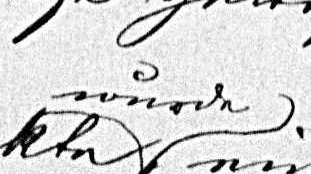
wurde
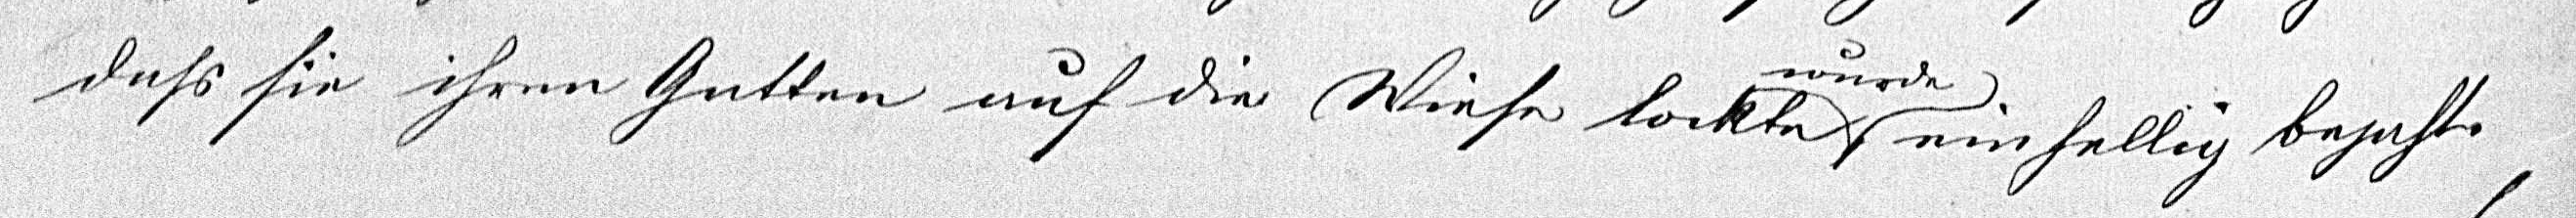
dass sie ihren Gatten auf die Wiese lockte einhellig bejahte
